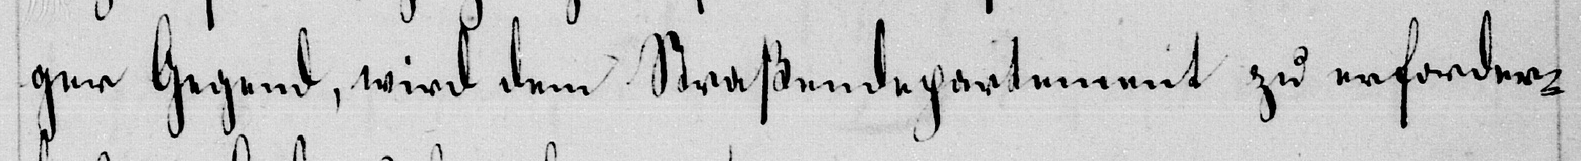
ger Gegend, wird dem Straßendepartement zu erforder¬
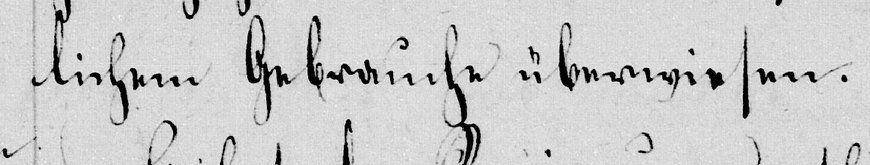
lichem Gebrauche überwiesen.
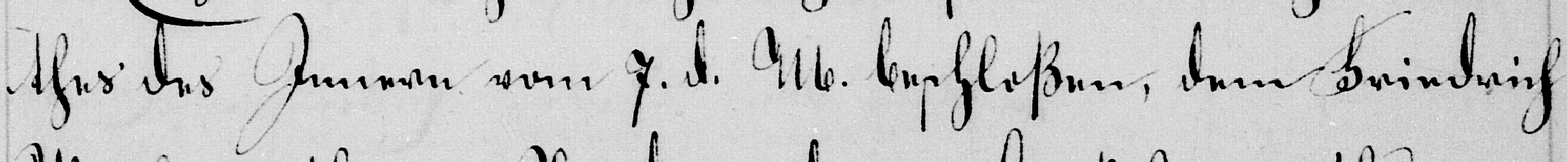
thes des Innern vom 7. d. M. beschloßen, dem Friedrich
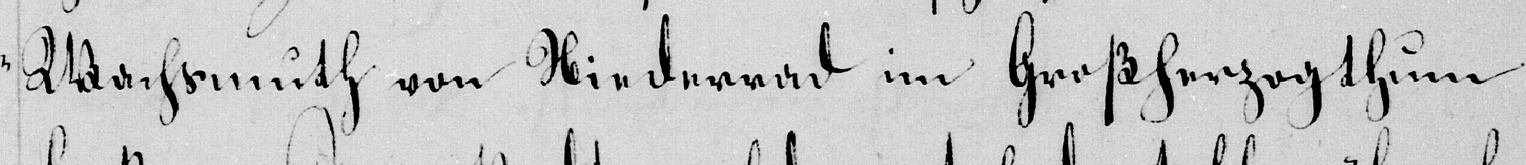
Wachsmuth von Niederrad im Großherzogthum
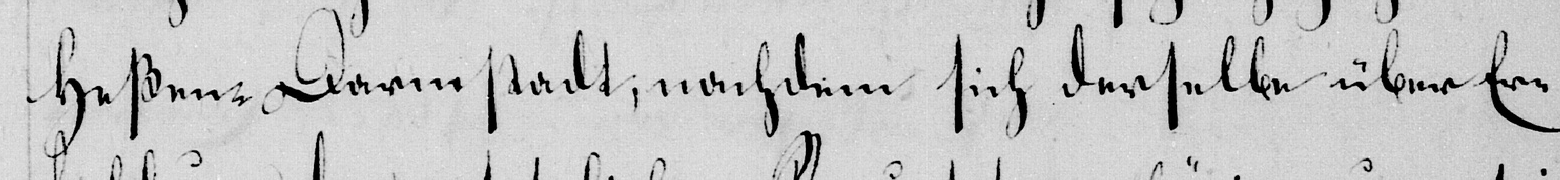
Heßen-Darmstadt, nachdem sich derselbe über Er¬
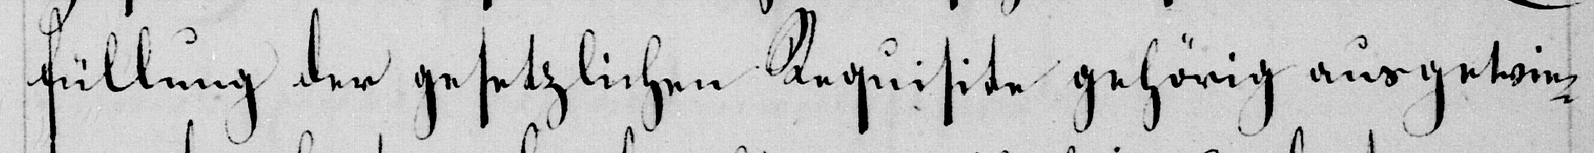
füllung der gesetzlichen Requisite gehörig ausgewie¬
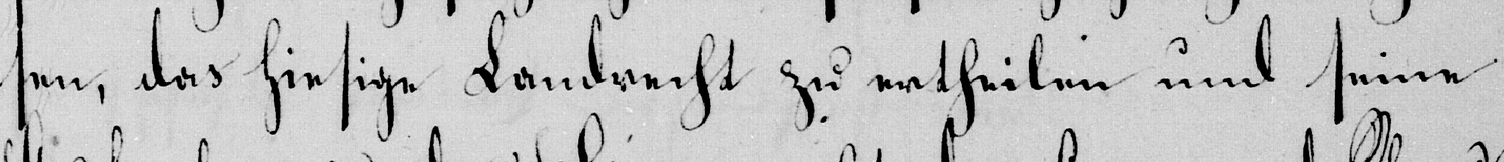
sen, das hiesige Landrecht zu ertheilen und seine
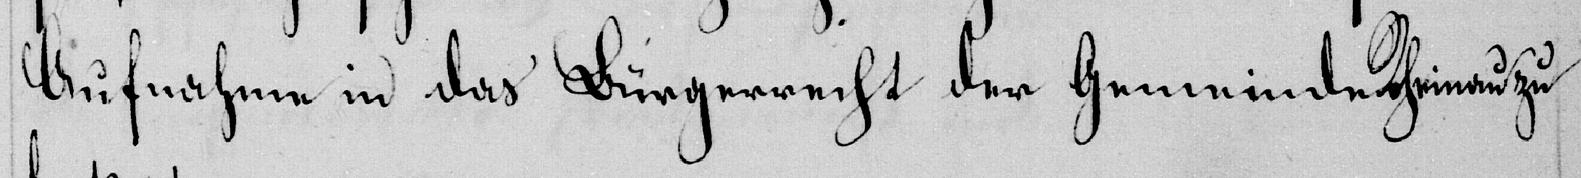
Aufnahme in das Bürgerrecht der Gemeinde Rheinau zu
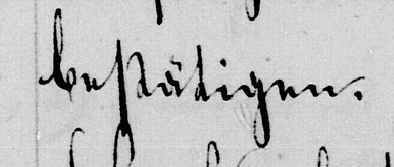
bestätigen.
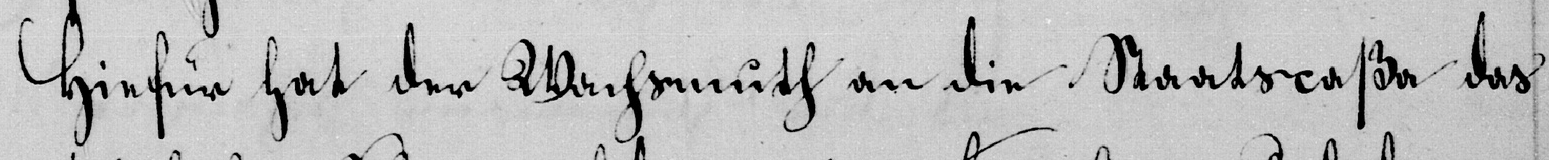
Hiefür hat der Wachsmuth an die Staatscaßa das
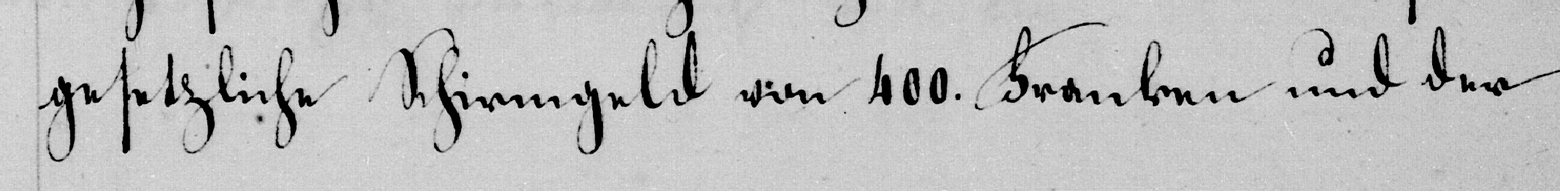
gesetzliche Schirmgeld von 400. Franken und der
